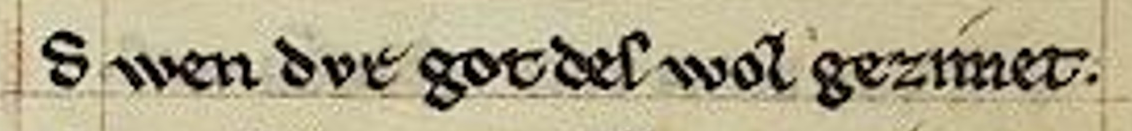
Swen dvr got deſ wol gezimet.
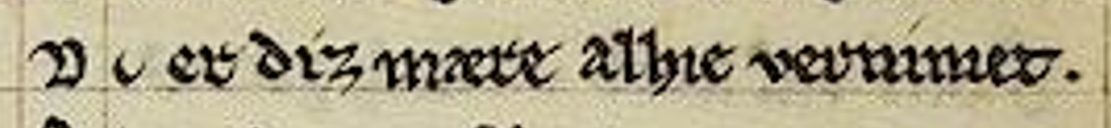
D(az) er diz m[ae]re alhie vernimet.
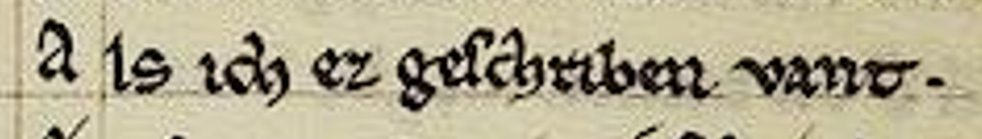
Als ich ez geſchriben vant.
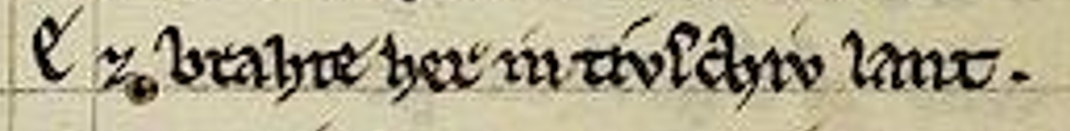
Ez brahte her in tivſchiv lant.
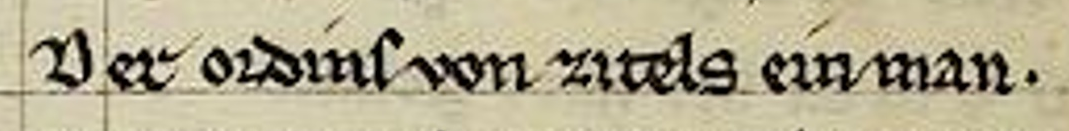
Der ordinſ von zitels ein man.
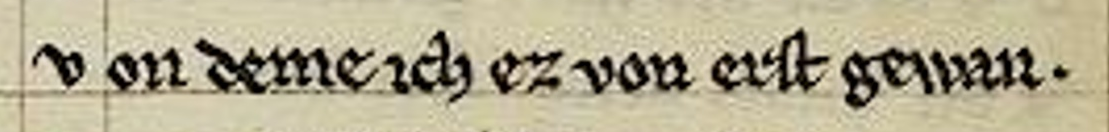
Von deme ich ez von erſt gewan.
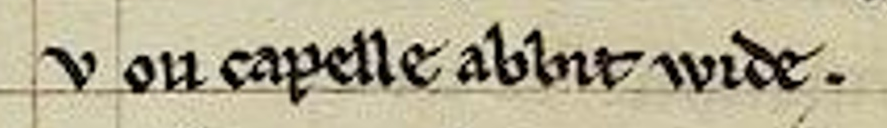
Von capelle abbit wide.
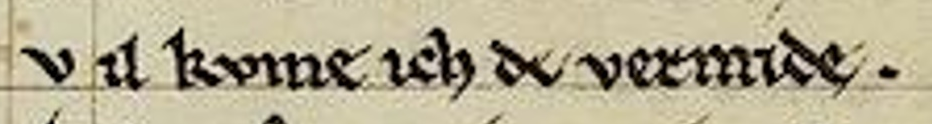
Vil kvme ich d(az) vermide.
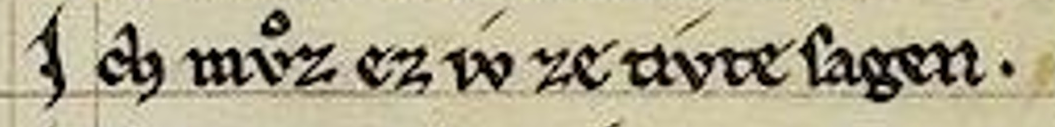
Ich mv°oz ez iv ze tivte ſagen.
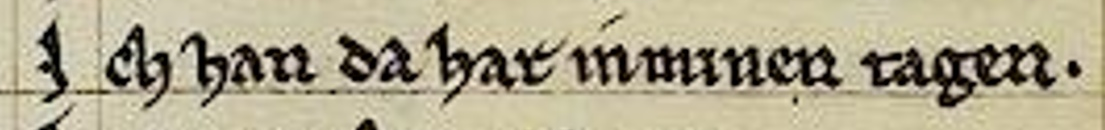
Ich han da har in minen tagen.
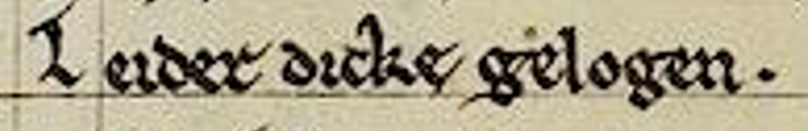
Leider dicke gelogen.
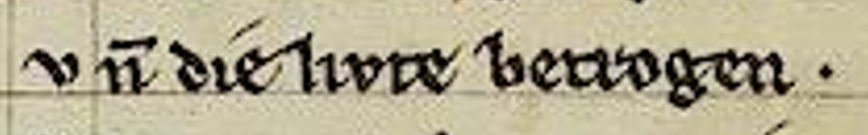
Vn(d) die livte betrogen.
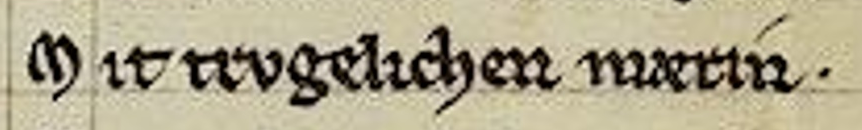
Mit trvgelichen m[ae]rin.
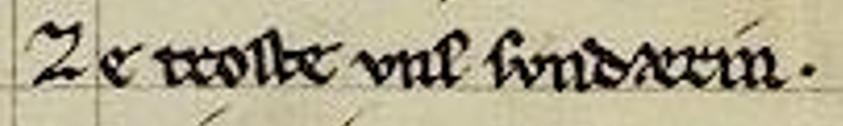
Ze troſte vnſ ſvnd[ae]rin.
